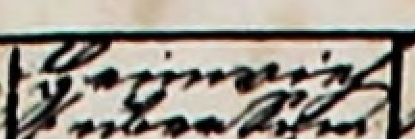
Heimvieh
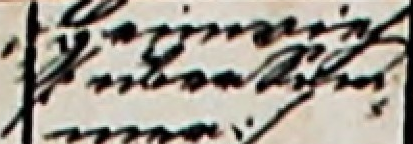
über S???
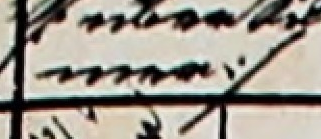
mer.
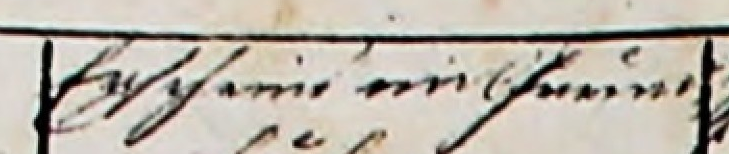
Erscheint im Grund„
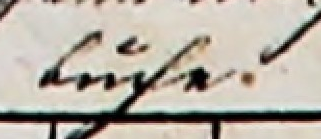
buche
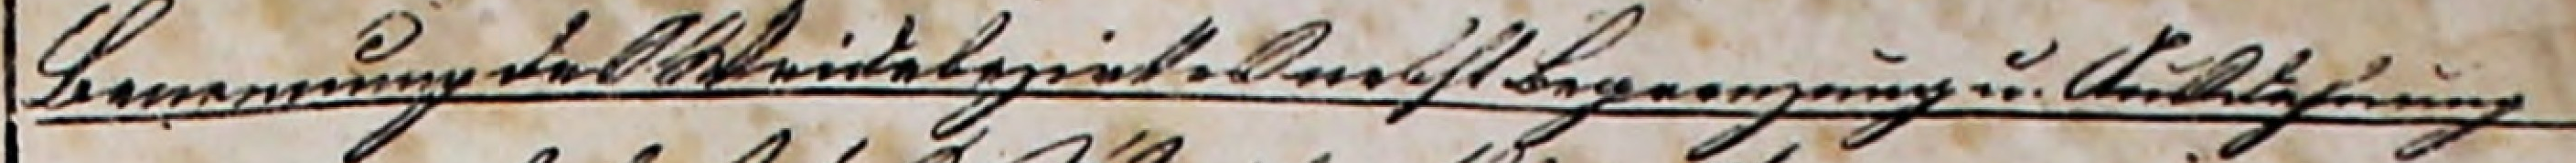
Benennung des Weidabezirkes nebst Begrenzung u. Ausdehnung
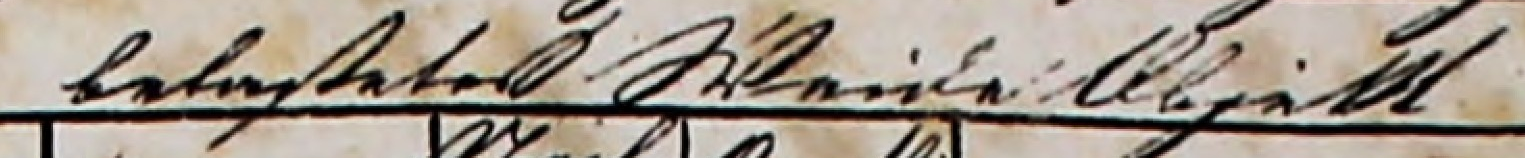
belaßetes Weide Objekt
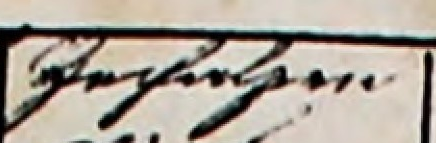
Zechalgen
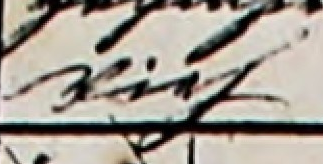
Vieh
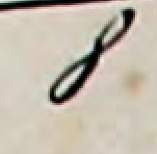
8
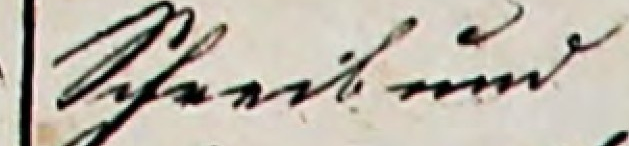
Schreib und
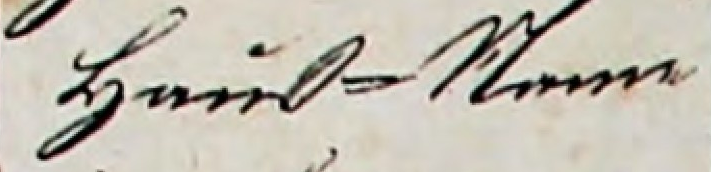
Haus=Name
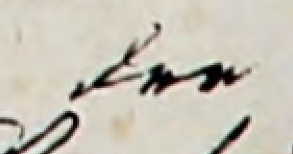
der
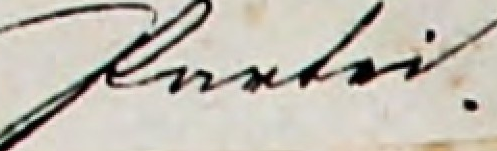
Partei
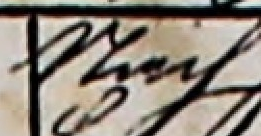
Nach
